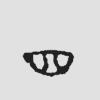四
